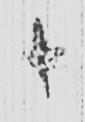十
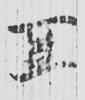五
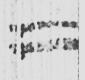二
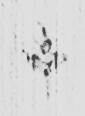十
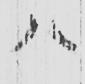八
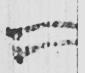二
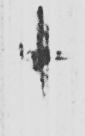十
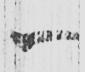一
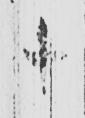十
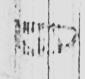四
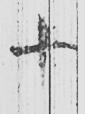七
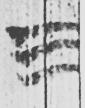三
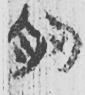刖
